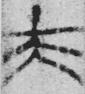夫
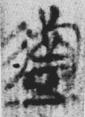○（失）
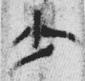少（小）
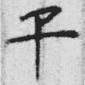子
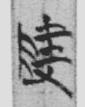隨
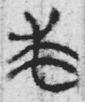求
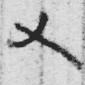又（有）
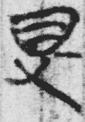○（得）
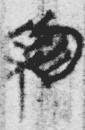利
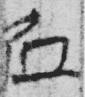凥（居）
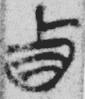貞
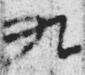九
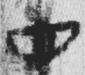四
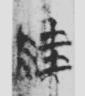隨
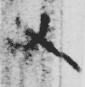又（有）
